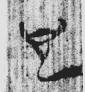也
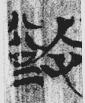○（豫）
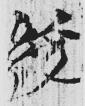絞
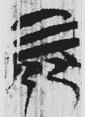而
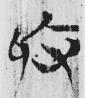收
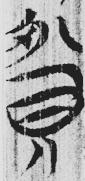貧
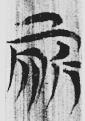所
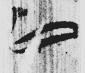㠯（以）
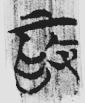取
